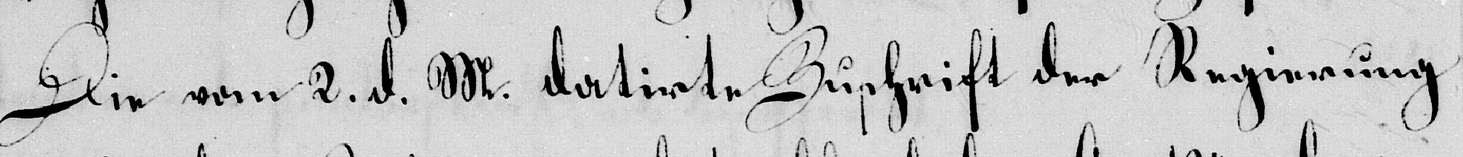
Die vom 2. d. M. datirte Zuschrift der Regierung
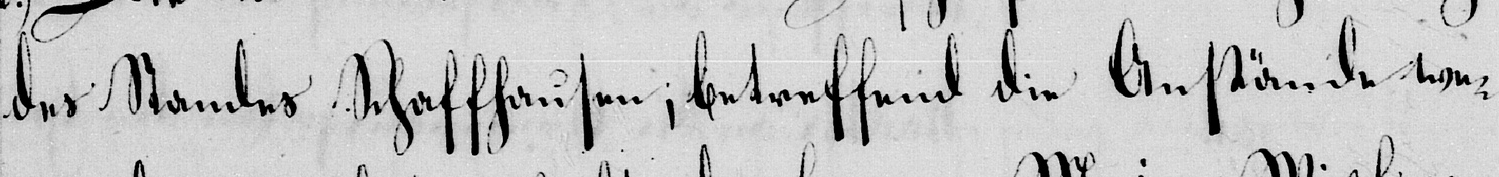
des Standes Schaffhausen, betreffend die Anstände we¬
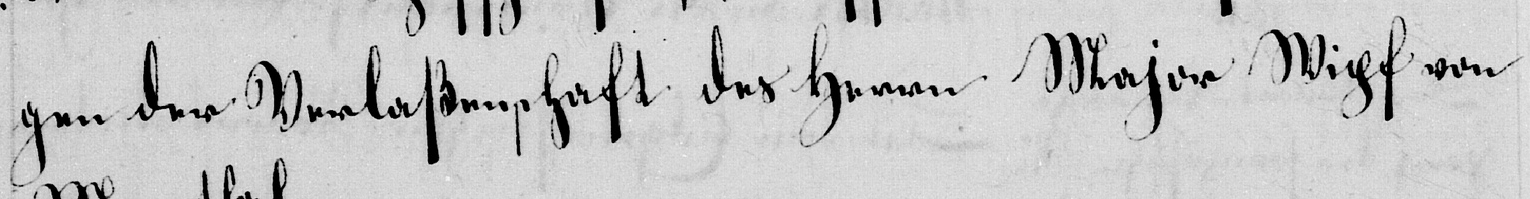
gen der Verlaßenschaft des Herrn Major Wipf von
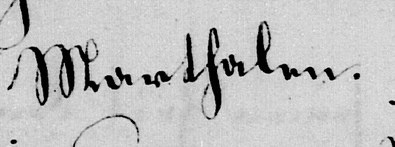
Marthalen.
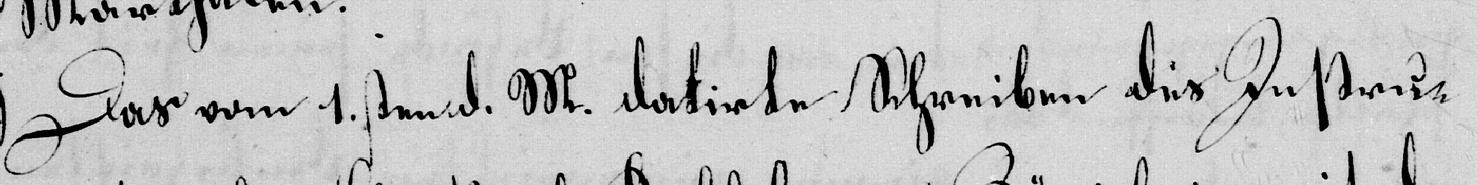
Das vom 1.sten d. M. datirte Schreiben des Instru¬
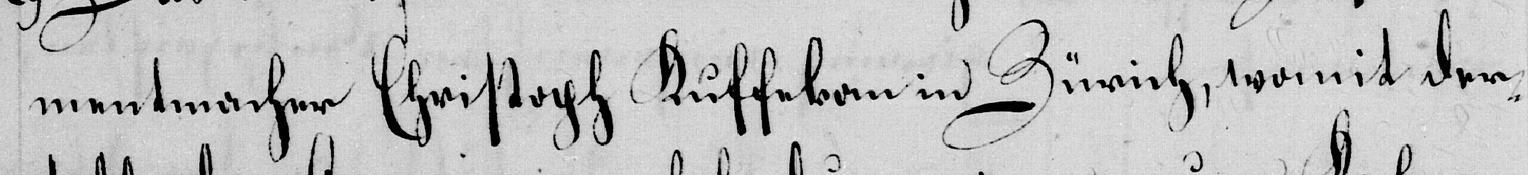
mentmacher Christoph Kuffekom in Zürich, womit der¬
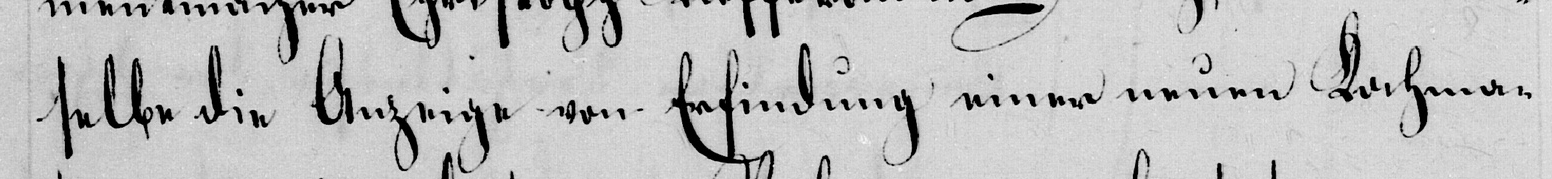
selbe die Anzeige von Erfindung einer neuen Kochma¬
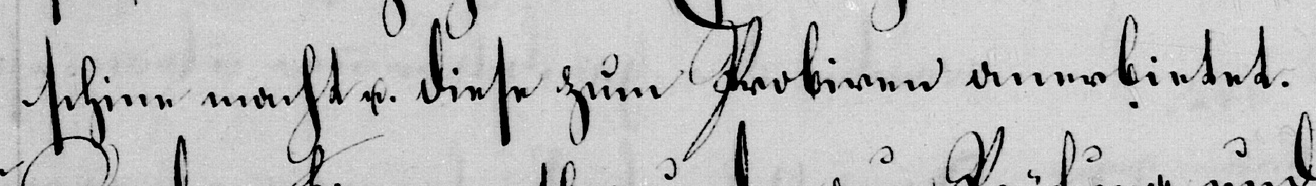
schine macht u. diese zum Probieren anerbietet.
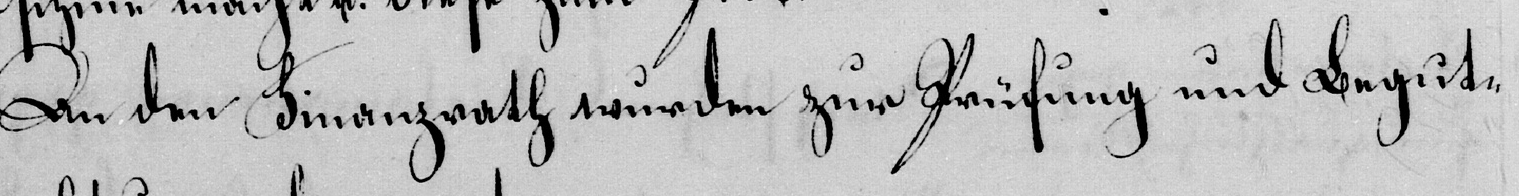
An den Finanzrath wurden zur Prüfung und Begut¬
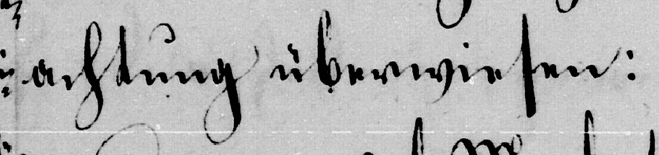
achtung überwiesen:
